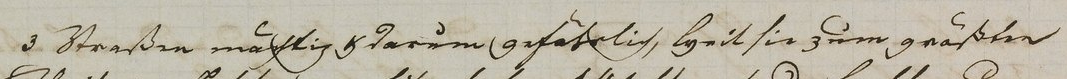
3 Straßen mächtig & darum gefährlich, weil sie zum größten
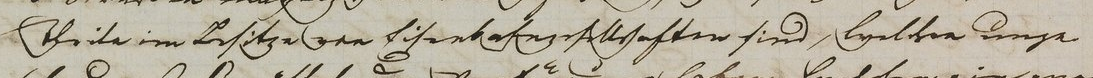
Theile im Besitze von Eisenbahngesellschaften sind, welchen unge-
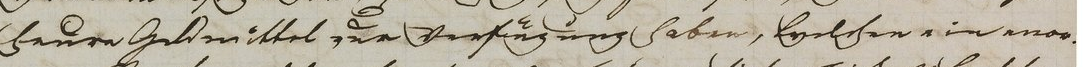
heure Geldmittel zur Verfügung haben, welchen ein enor-
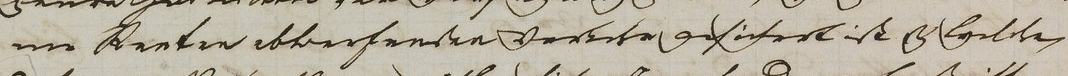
me Renten abwerfenden Verkehr gesichert ist & welche
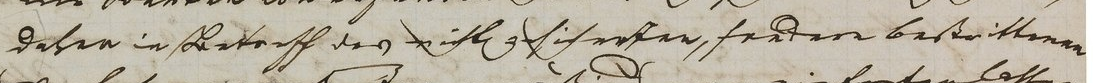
daher in Betreff des nicht gesicherten, sondern bestrittenen
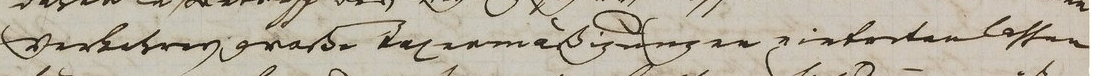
Verkehres große Taxermäßigungen eintreten lassen
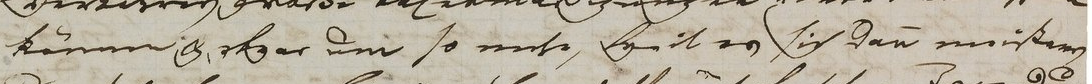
können & zwar um so mehr, weil es sich dann meistens
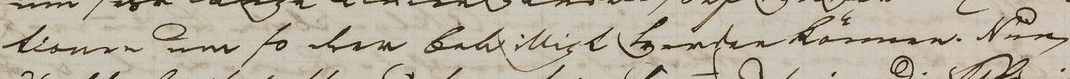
tionen um so eher bewilligt werden können. Nur
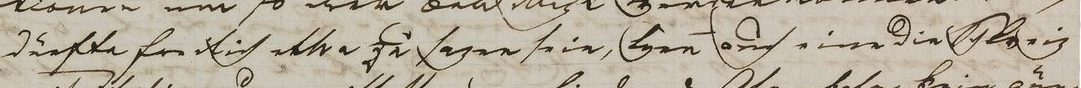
dürfte freilich etwa zu sagen sein, wenn auch eine die Schweiz
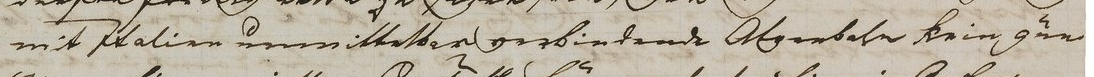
mit Italien unmittelbar verbindende Alpenbahn kein gün-
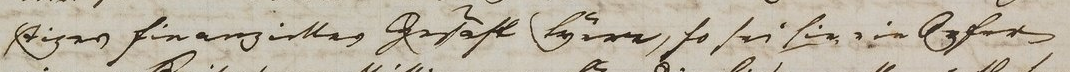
stiges finanzielles Geschäft wäre, so sei sie ein Opfer
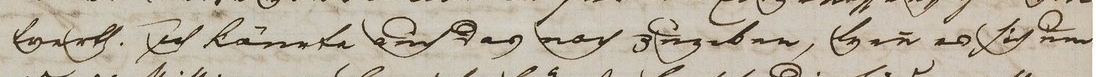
werth. Ich könnte auch das noch zugeben, wenn es sich um
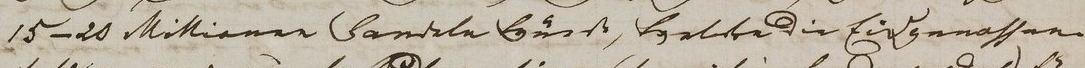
15–20 Millionen handeln würde, welche die Eidgenossen-
